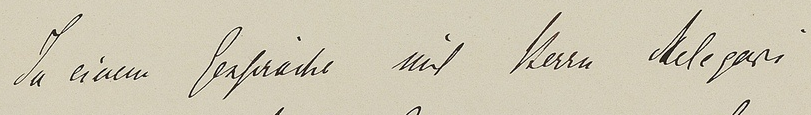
In einem Gespräche mit Herrn Melegari
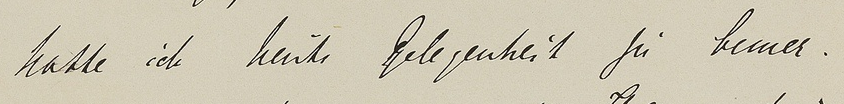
hatte ich heute Gelegenheit zu bemer-
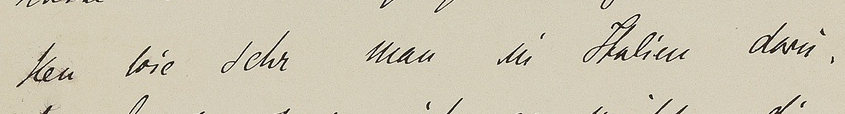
ken wie sehr man in Italien darü-
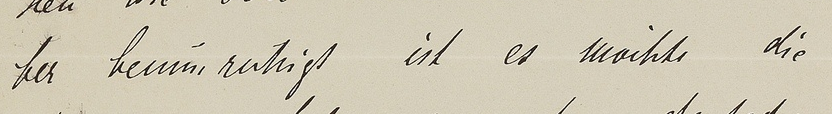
ber beunruhigt ist es möchte die
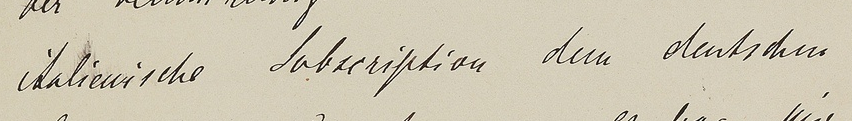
italienische Subscription dem deutschen
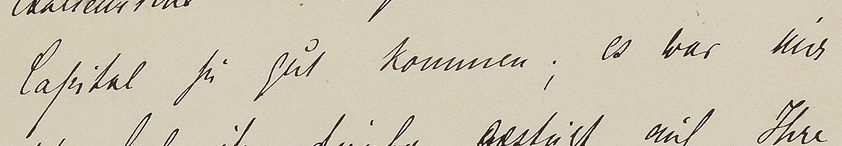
Capital zu gut kommen; es war mir
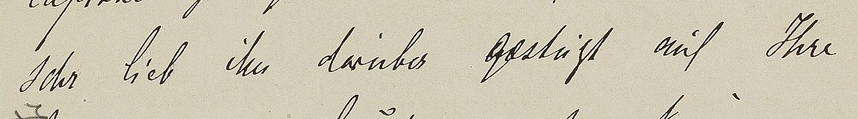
sehr lieb ihn darüber gestüzt auf Ihre
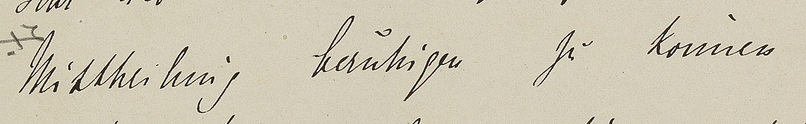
Mittheilung beruhigen zu können.
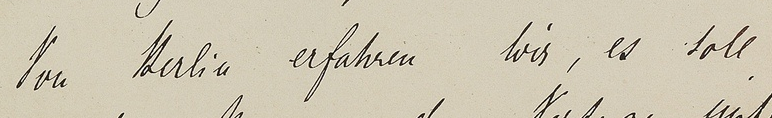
Von Berlin erfahren wir, es soll
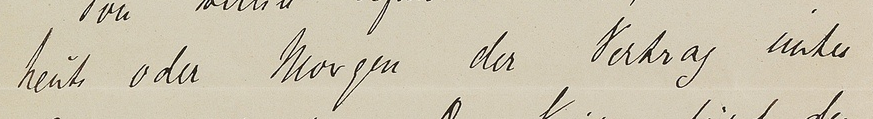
heute oder morgen der Vertrag unter-
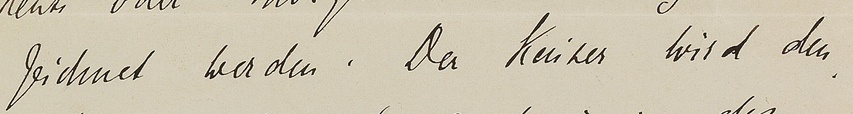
zeichnet werden. Der Kaiser wird den-
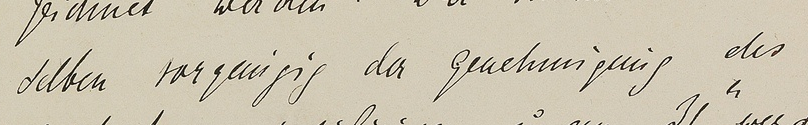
selben vorgängig der Genehmigung des
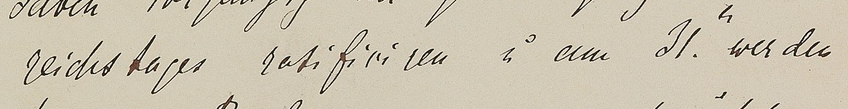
Reichstages ratificiren u am 31t werden
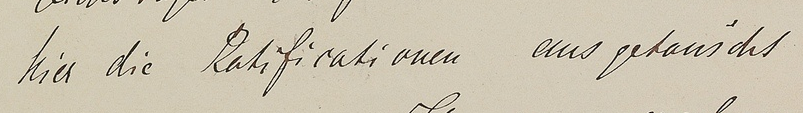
hier die Ratificationen ausgetauscht.
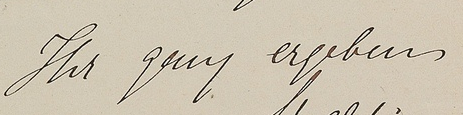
Ihr ganz ergebener
